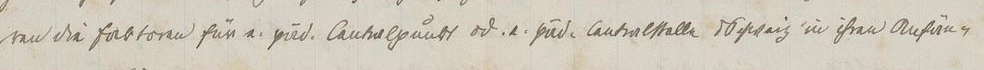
ren die Faktoren für e. päd. Centralpunkt od. e. päd. Centralstelle d Schweiz in ihren Anfän-
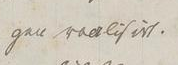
gen realisirt.
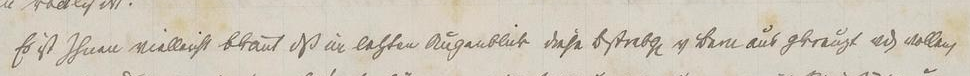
Es ist Ihnen vielleicht bkannt dß im letzten Augenblick diese Bstrebgen von Bern aus gkreuzt wden wollen,
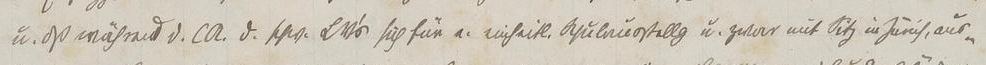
u. dß während d. CA. d. schw. LV's sich für e. einheitl. Schulausstellg u. zwar mit Sitz in Zürich, aus-
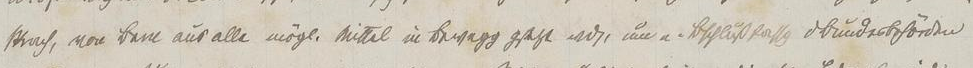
sprach, von Bern aus alle mögl. Mittel in Bewegg gsetzt wden, um e. Bschlußfassg d Bundesbehörden
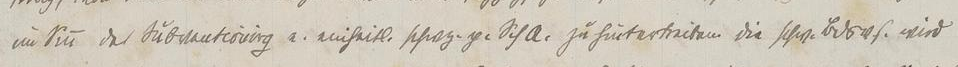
im Sinn der Subventionirg e. einheitl. schwz. p. SchA. zu hintertreiben. Die schw. Bdsvs. wird
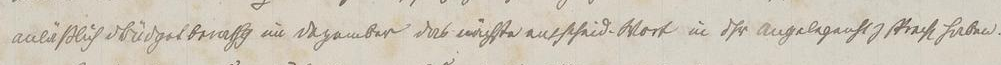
anläßlich d Büdgetberathg im Dezember das nächste entscheid. Wort in dsr Angelegenht z sprechen haben.
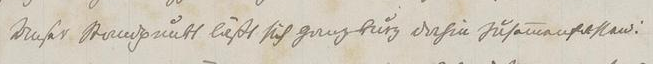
Unser Standpunkt läßt sich ganz kurz dahin zusammenfassen:
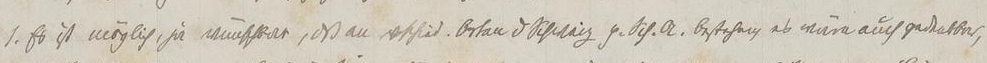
1. Es ist möglich, ja wünschbar, dß an vschied. Orten d Schweiz p. Sch.A. bestehen, es wäre auch gednkbar,
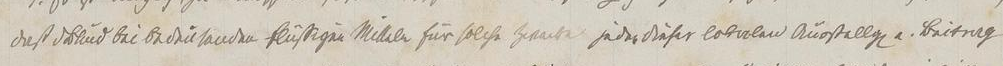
daß d Bund bei bedeutenden flüßigen Mitteln für solche Zwecke jeder dieser lokalen Ausstellg e. Beitrag
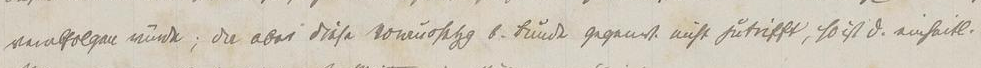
verabfolgen würde; da aber diese Voraussetzg b. Bunde gegenw. nicht zutrifft, so ist d. einheitl.
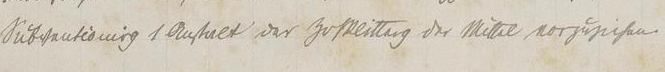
Subventionirg 1 Anstalt der Zrsplitterg der Mittel vorzuziehen.
